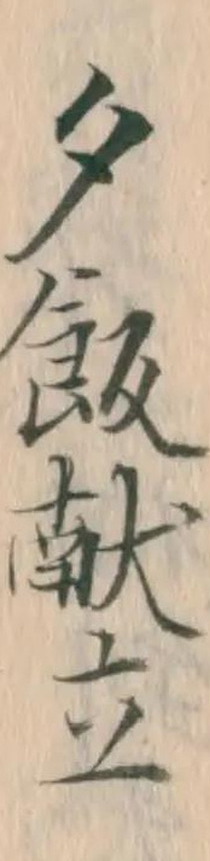夕飯献立
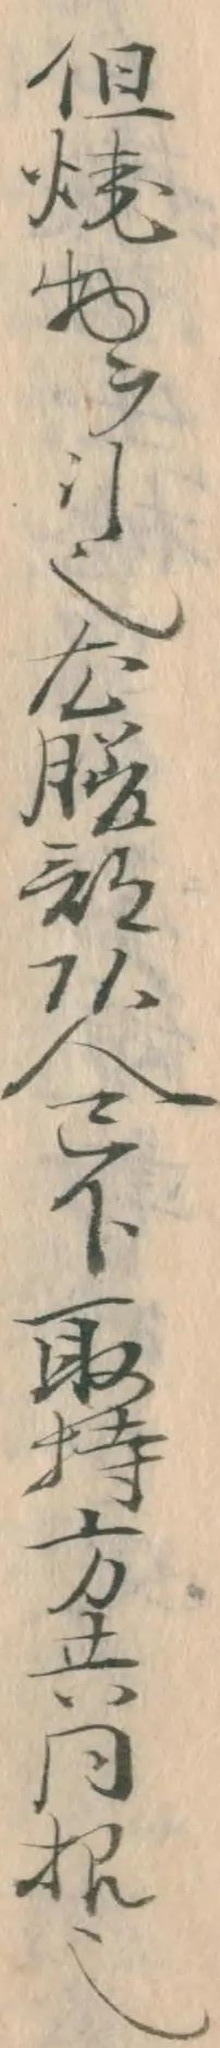但焼物ヲ引也尤膳部頭人已下取持方共同様也
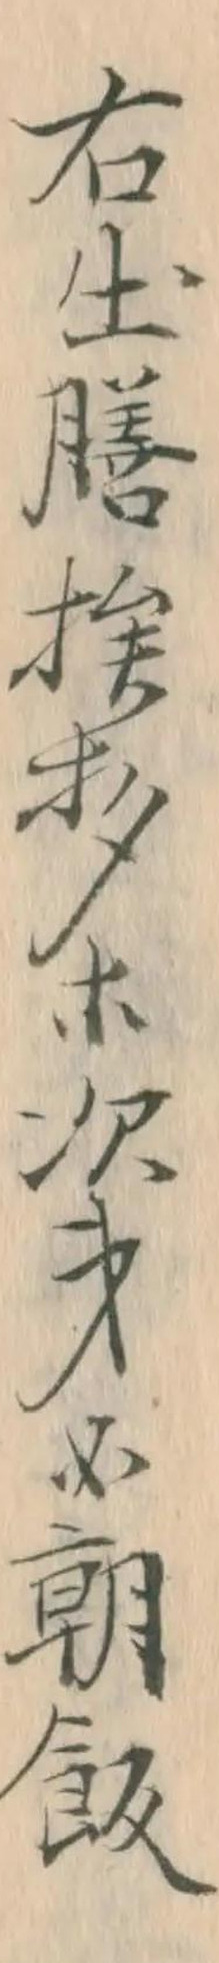右出膳挨拶等次第如朝飯

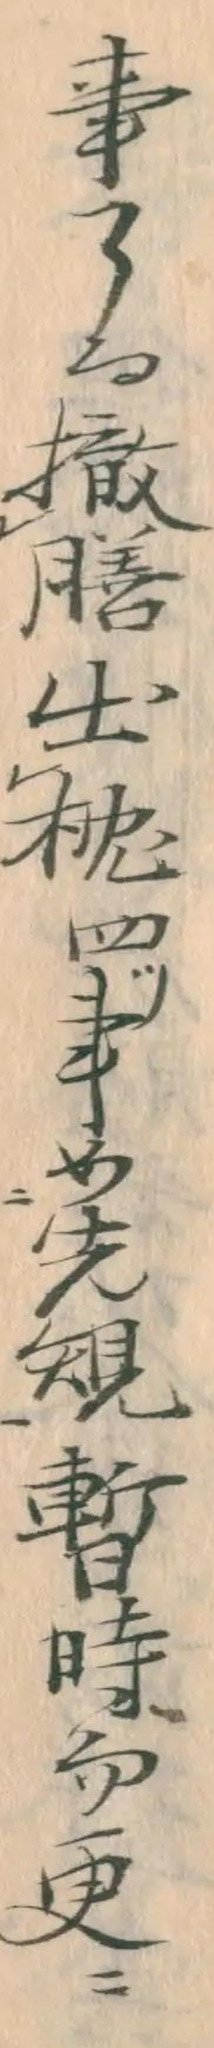事了而撒膳出枕四ツ事如先規暫時而更ニ
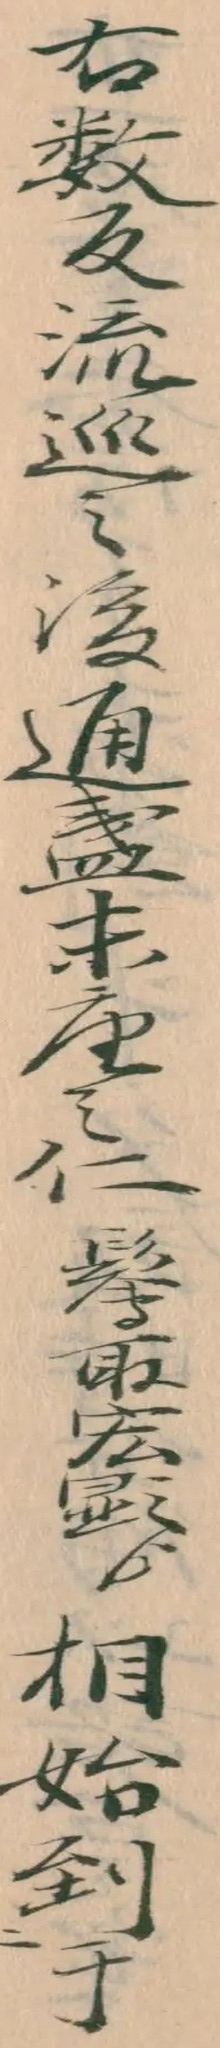右数反流巡之後通盞末座之仁鬠取宏顕ゟ相始到于
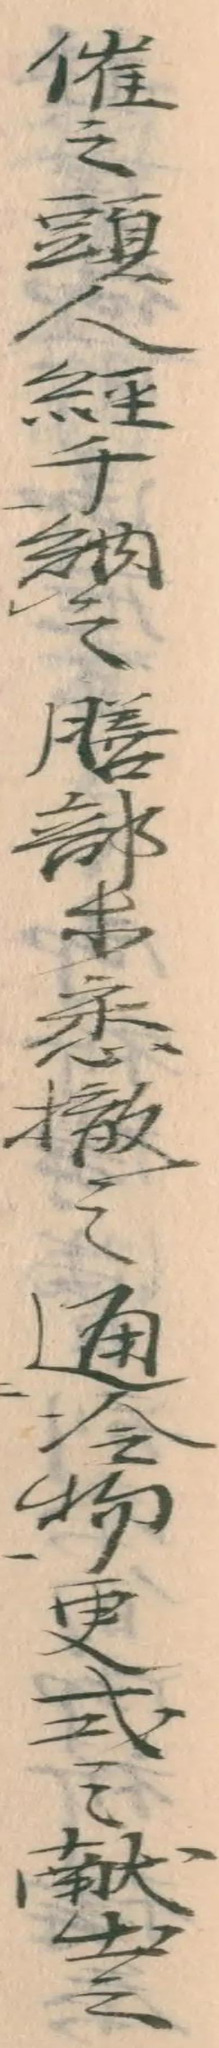催之頭人経千納之膳部等悉撤之通冷物更或式之献出之
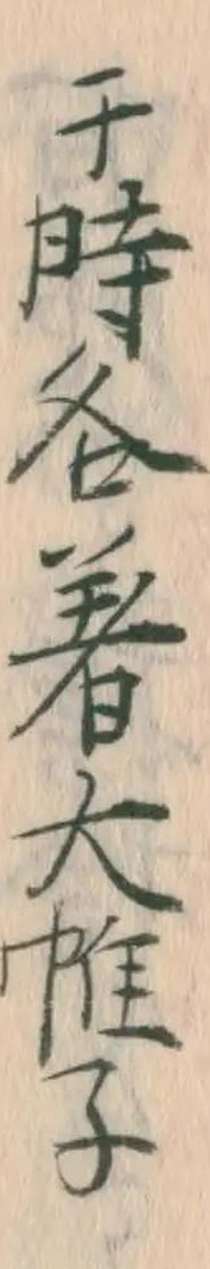于時各着大帷子
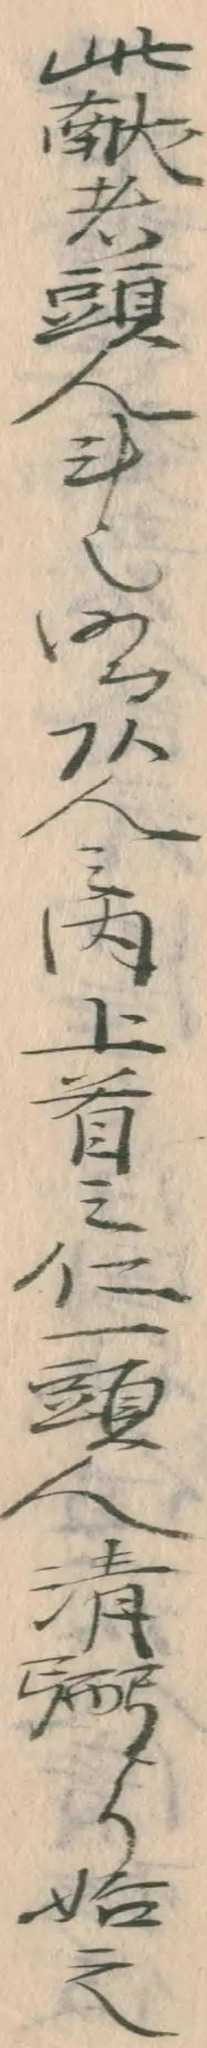此献者頭人斗也仍而頭人之内上首之仁一頭人清弼より始之
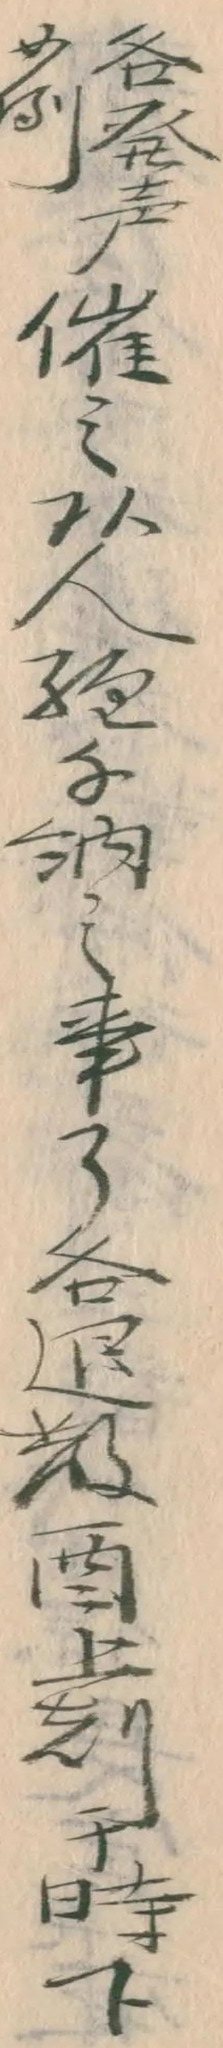各発声如例催之頭人経子納之事了各退散酉上刻于時下
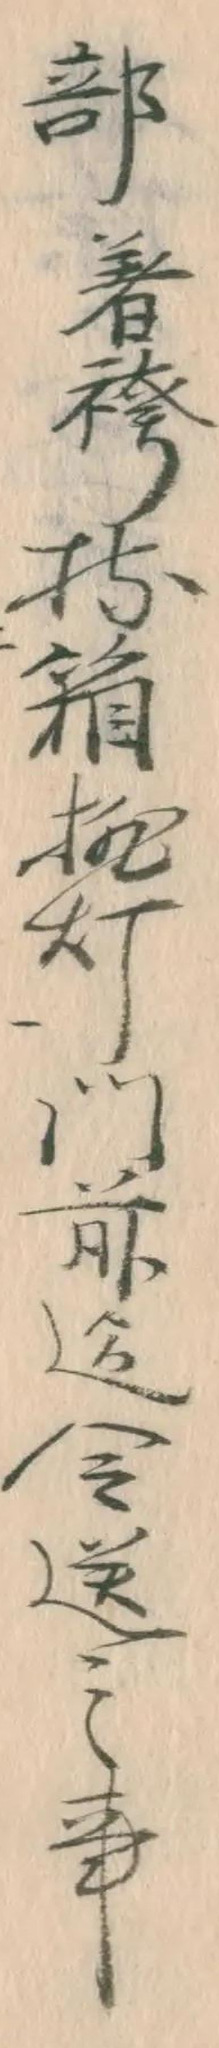部着袴持箱挑灯門前迄令送之事
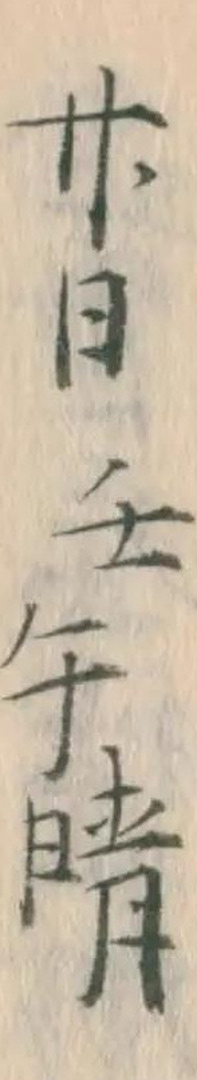廿日壬午晴
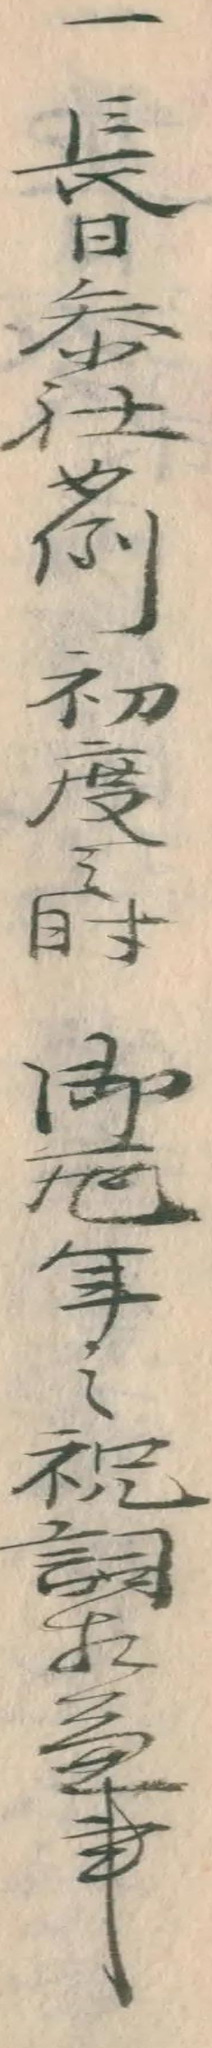一長日参社如例初度之時御厄年之祝詞相兼事
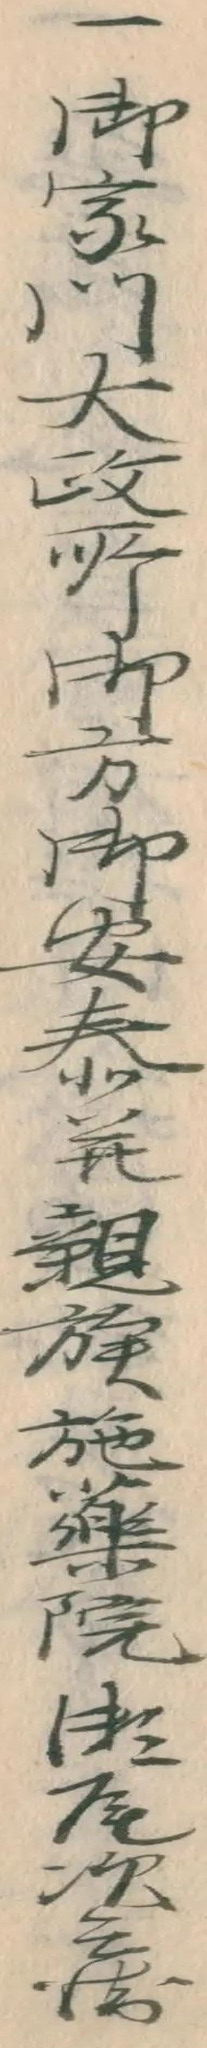一御家門大政所御方御安泰并親族施薬院瀬尾次兵衛
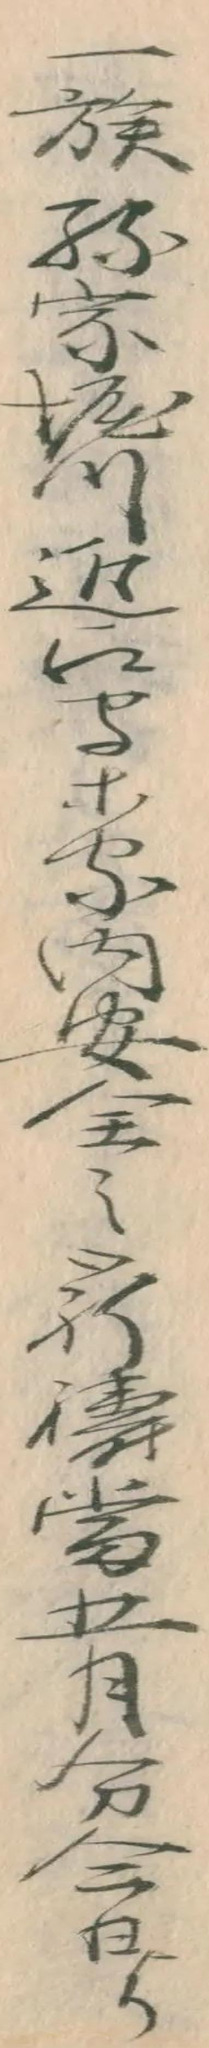一族縁家堀川近江守等家内安全之御祈祷當五月分今日より

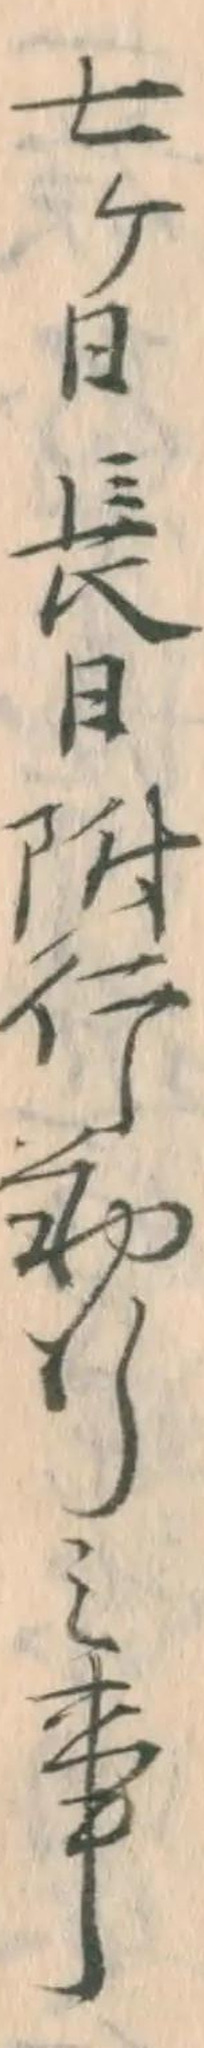七ヶ日長日附行勤行之事
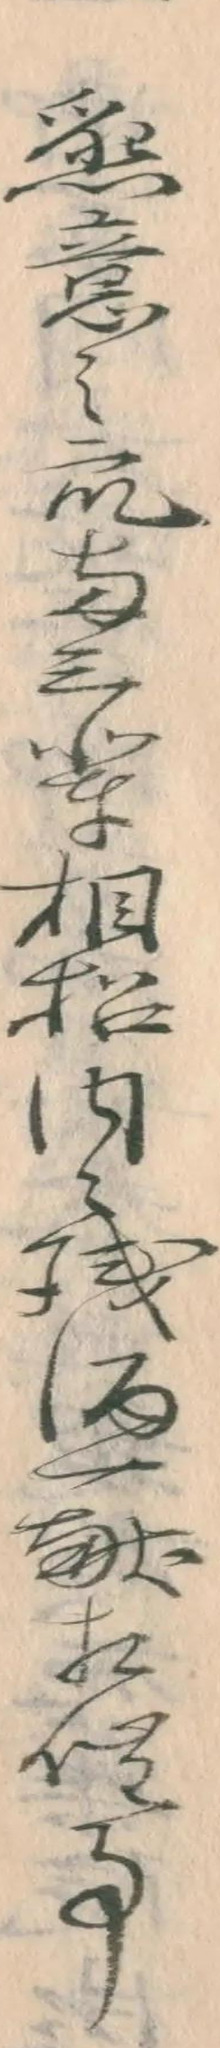一懇意之衆両三輩相招内々残酒一献相催事
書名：賀茂社記録. 第73冊
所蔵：国立国会図書館 National Diet Library, JAPAN
